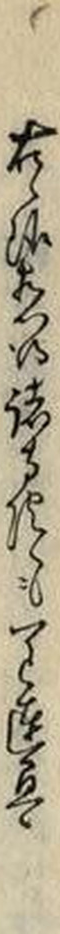右之趣相心得諸寺院へも可被達置候
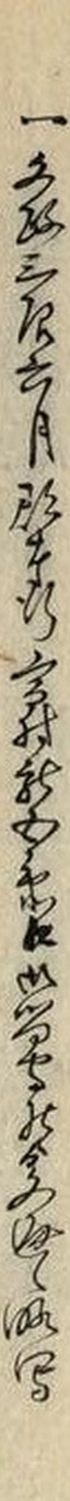一文政三辰六月郡奉行高村新五兵衛江御留守居ゟ文通之略写
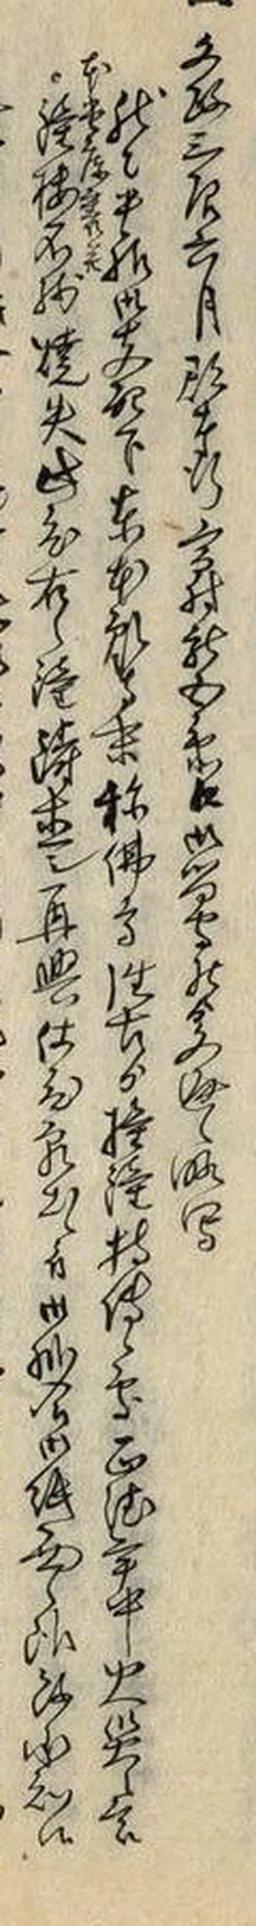然者貴様御支配下東本願寺末称仏寺往古ゟ撞鐘持伝候処正徳年中火災之節
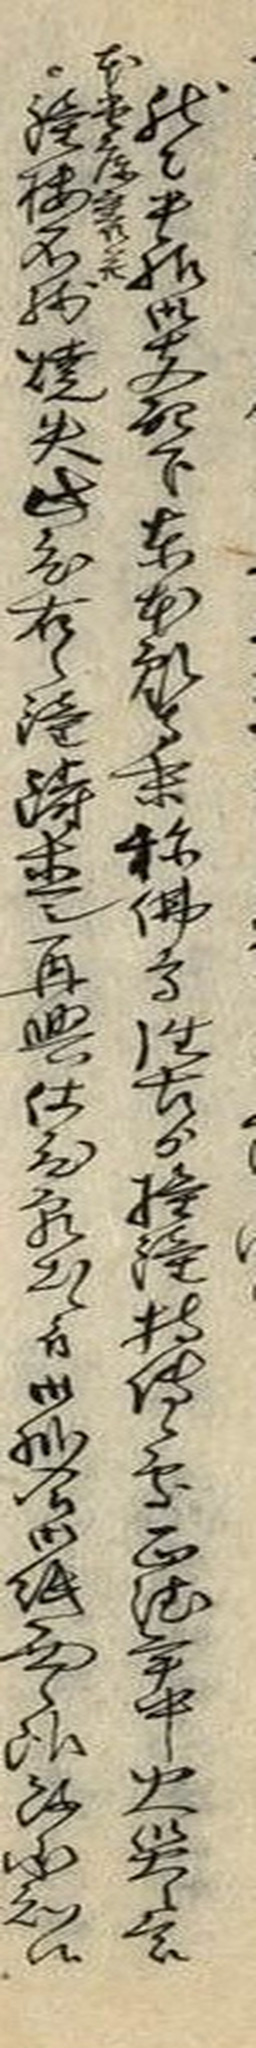本堂庫裏幷鐘楼不残焼失此度右之鐘鋳直シ再興仕度願出候ニ付御掛合御紙面之趣致承知候
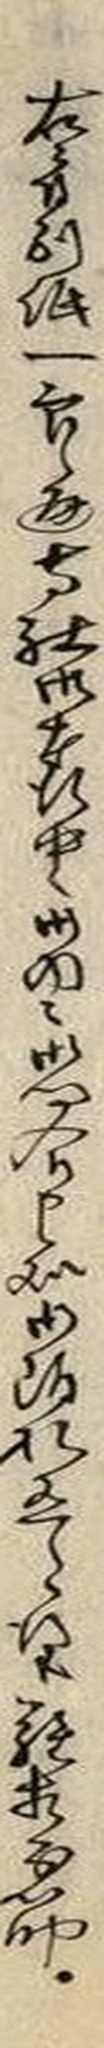右ニ付別紙一印之通寺社御奉行中へ御内々御問合申候処御附札有之候得共
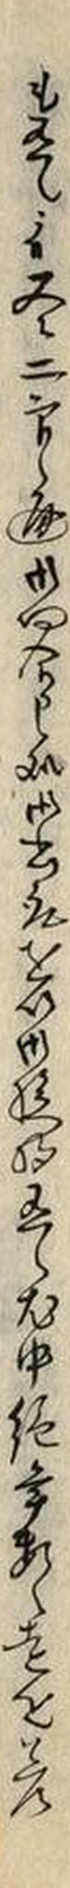も有之ニ付又々二印之通御問合申候処御書取を以御挨拶有之尤中絶年数之遠近差
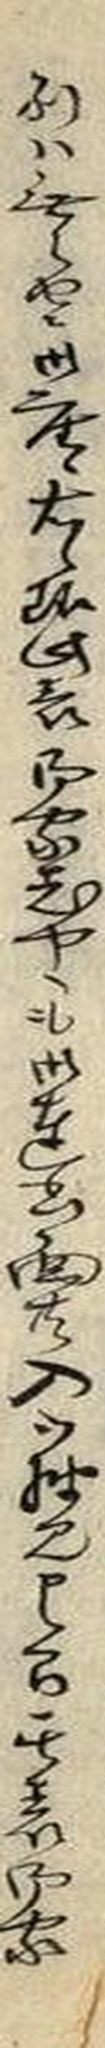別ハ無之由ニ御座候右之趣此表御家老中へも御達書面共入御披見申候間其表御家
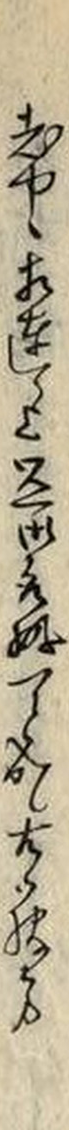老中へ相達候上宜御取扱可被成候右御報方
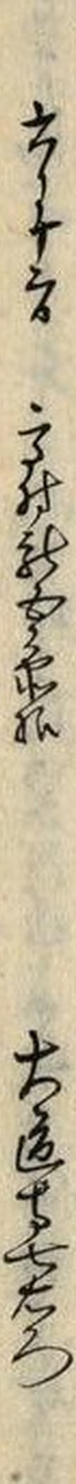六月十二日高村新五兵衛様萩原猪太夫
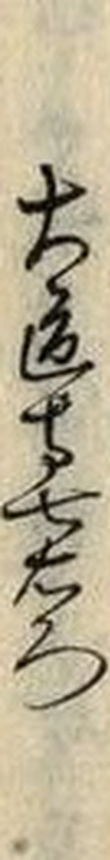大道寺七右衛門

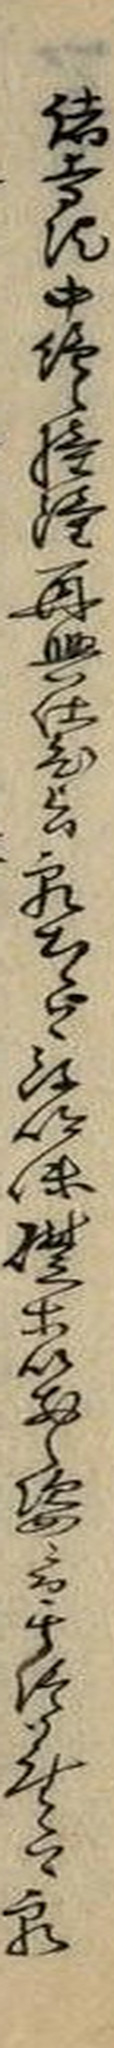諸寺院中絶之撞鐘再興仕度旨願出候ハヽ致吟味礎等以前之姿ニ而其儘御座候ハヽ願
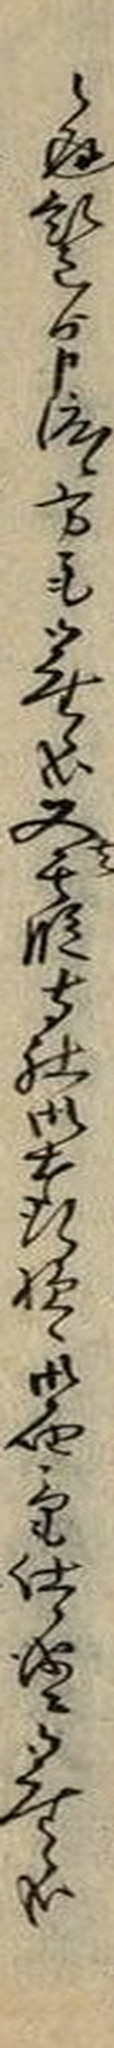之通領主ゟ申渡候方ニも御座候哉又者其段寺社奉行様へ御届ニ而も仕候儀ニ御座候哉
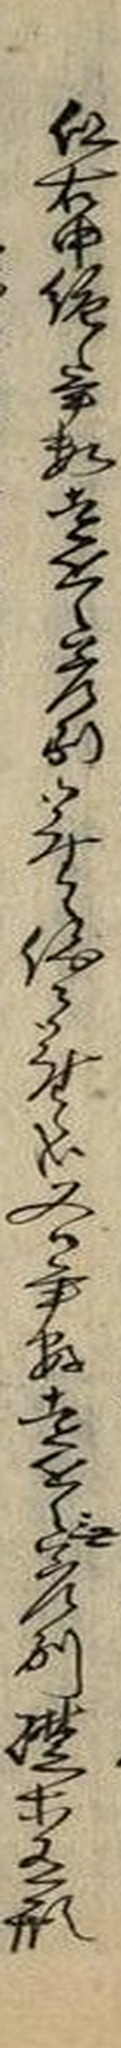但右中絶之年数遠近之差別御座候儀ニ御座候哉又ハ年数遠近之無差別礎等有形
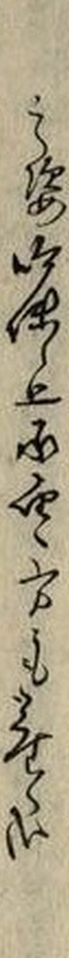之姿吟味之上承届候方ニも御座候哉
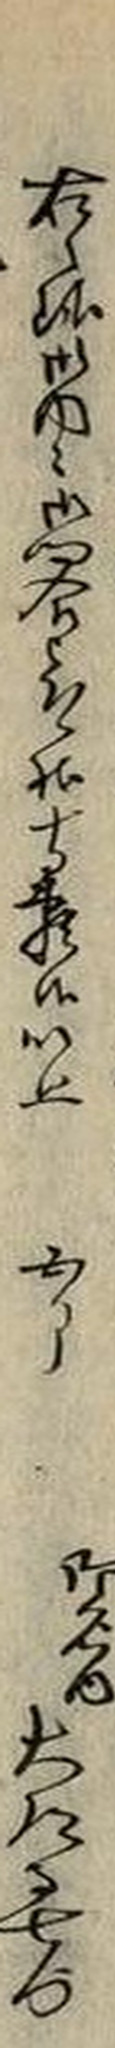右之趣御内々御問合被下候様奉頼候以上五月御名内大道寺七右衛門
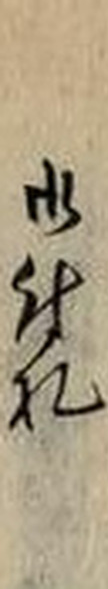御付札
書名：御国他国諸事之部
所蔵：福井県文書館 Fukui Prefectural Archives
